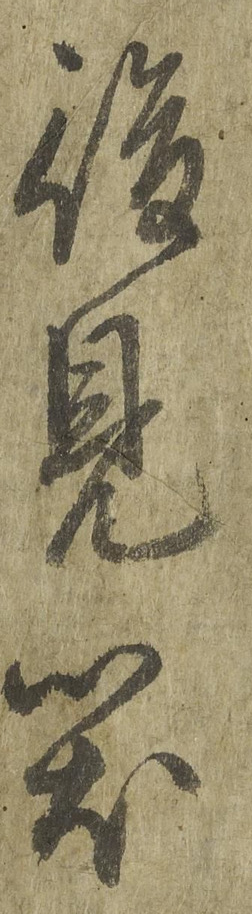後見笑

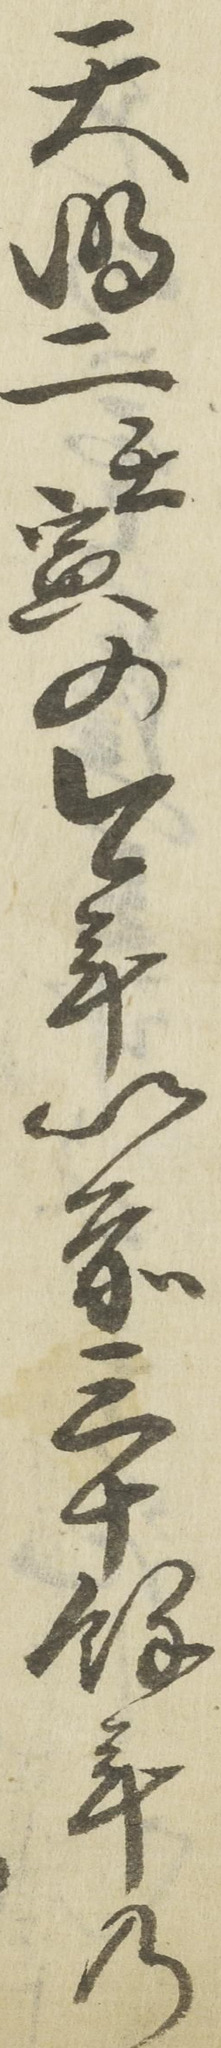天明二壬寅の今年以前三十餘年の
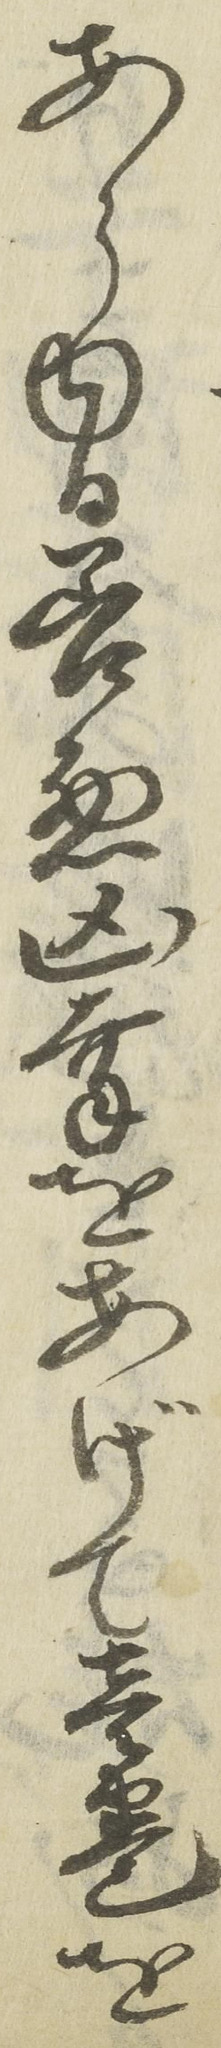あらゆる善悪凶幸をあげて壱巻を
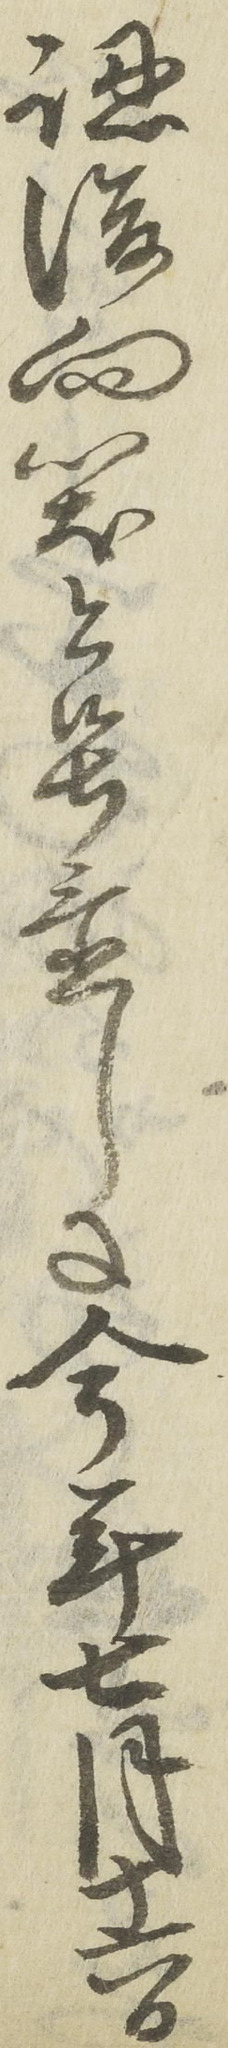認後向笑と号置しに今年七月十六日
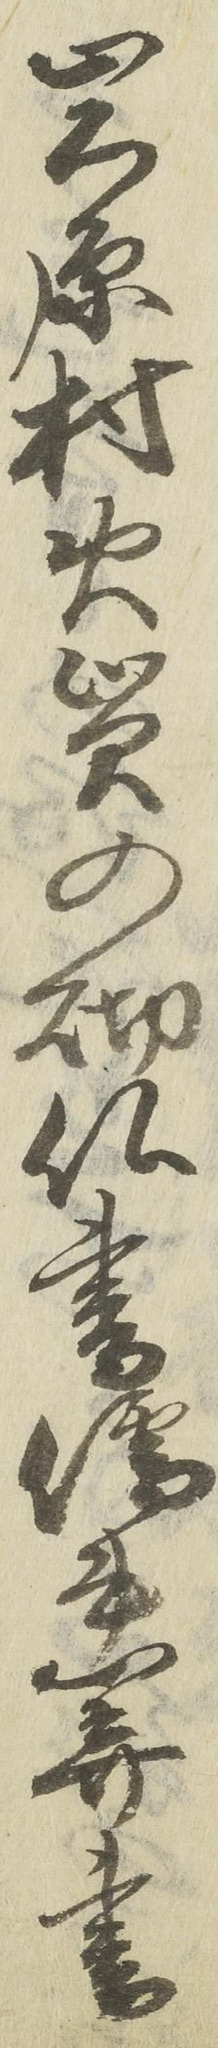岩原村火災の砌仏書儒書算書
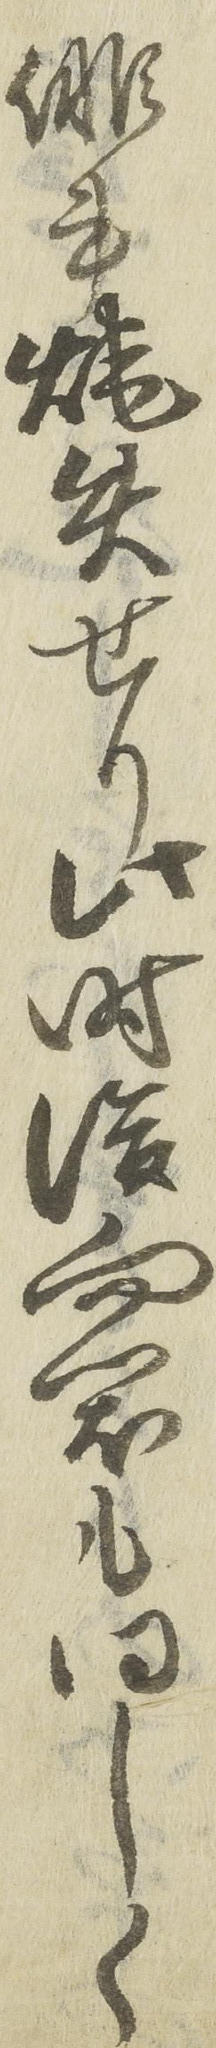俳書焼失せり此時後向笑も同しく
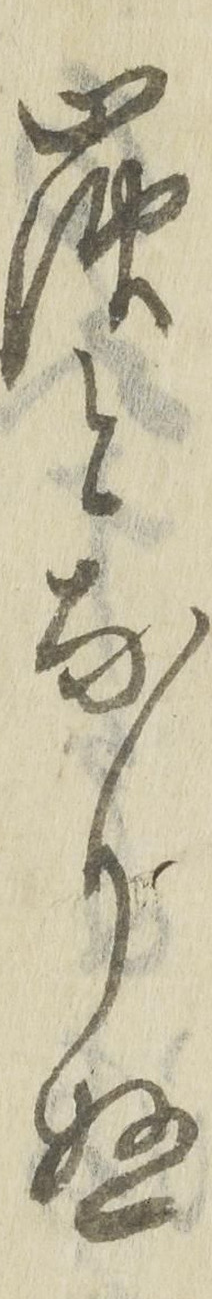炭となりぬ
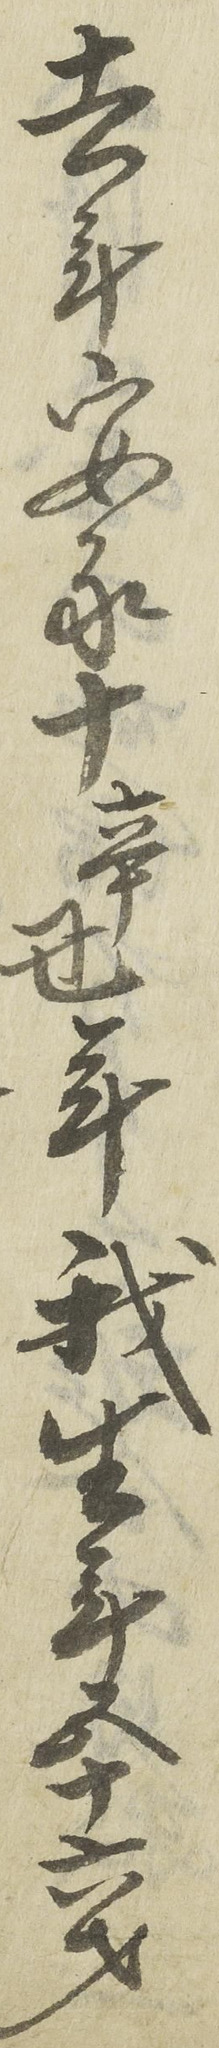去年安永十辛丑年我生年五十六才
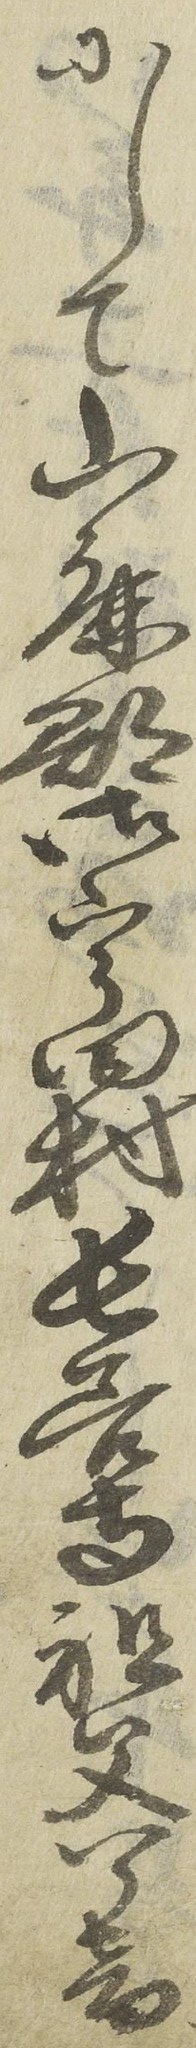にして山鹿郡御宇田村長善寺祖父了音
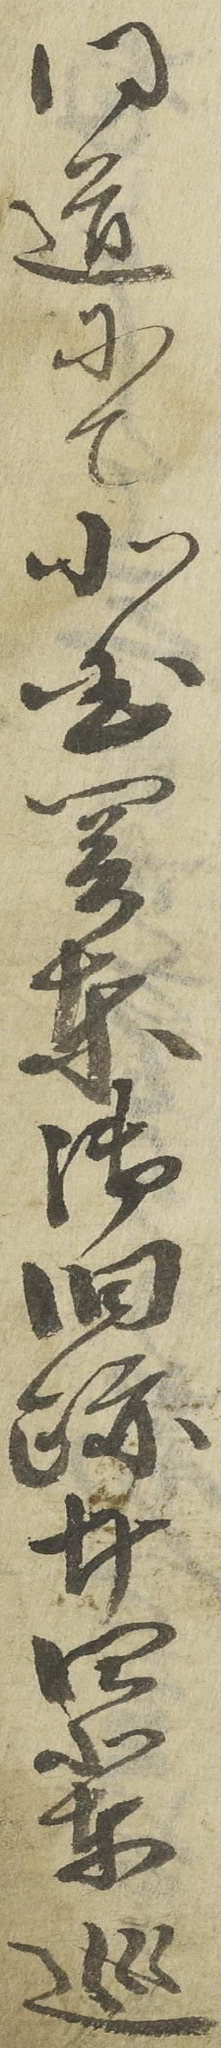同道にて北国関東御旧跡廿四輩巡

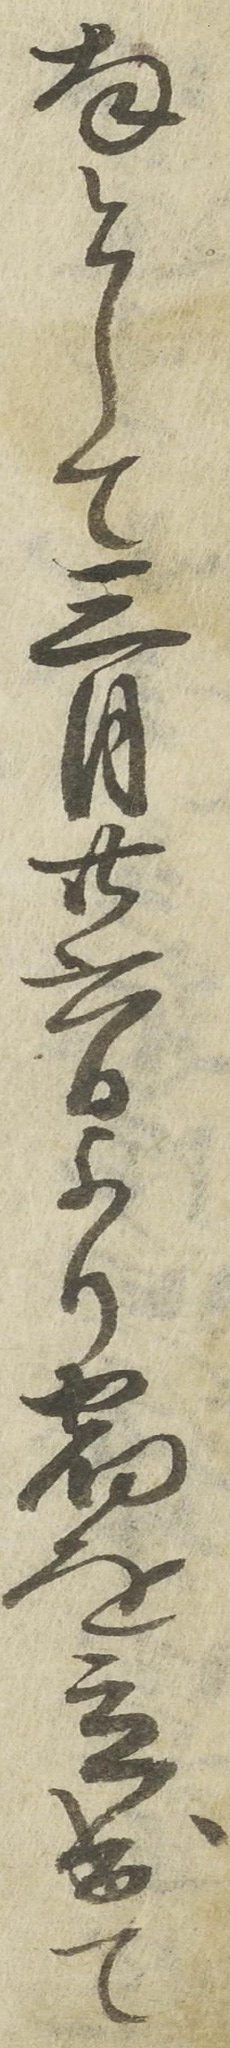拝として三月二十六日より宿を立出て
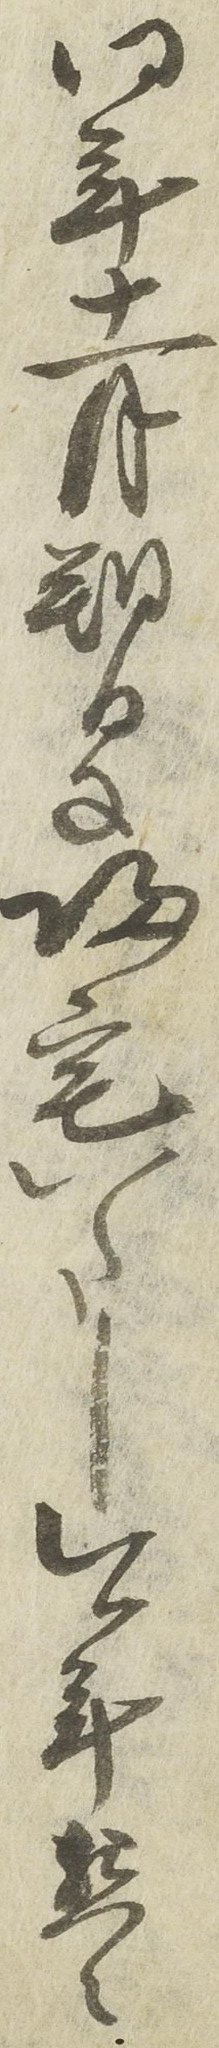同年十一月朔日に帰宅いたし今年態々
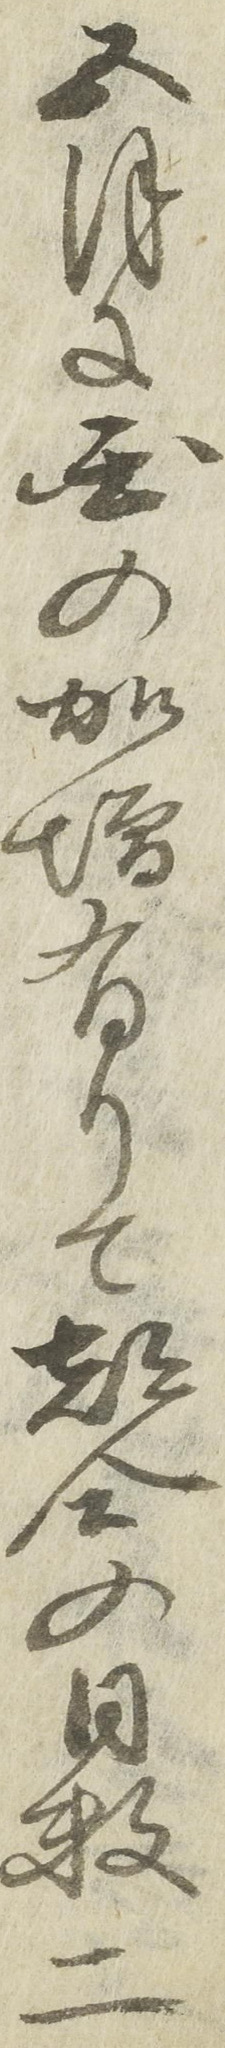五月に国の加増有りて都合の日数二
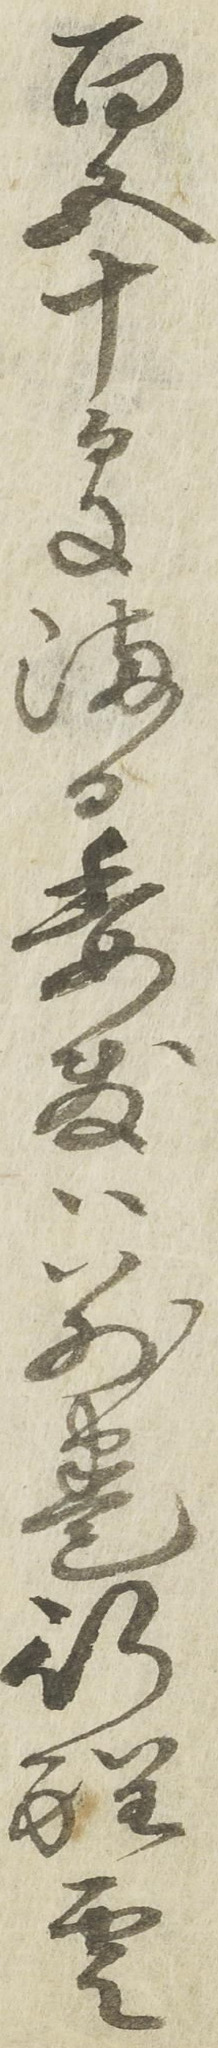百五十日に満る委敷は前巻行程雲
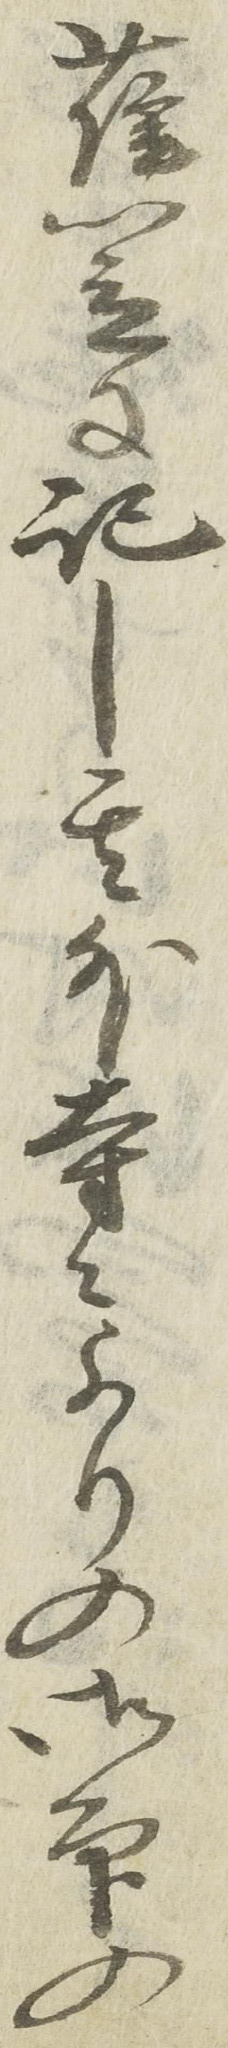藺笠に記し其外寺〻よりの御印の
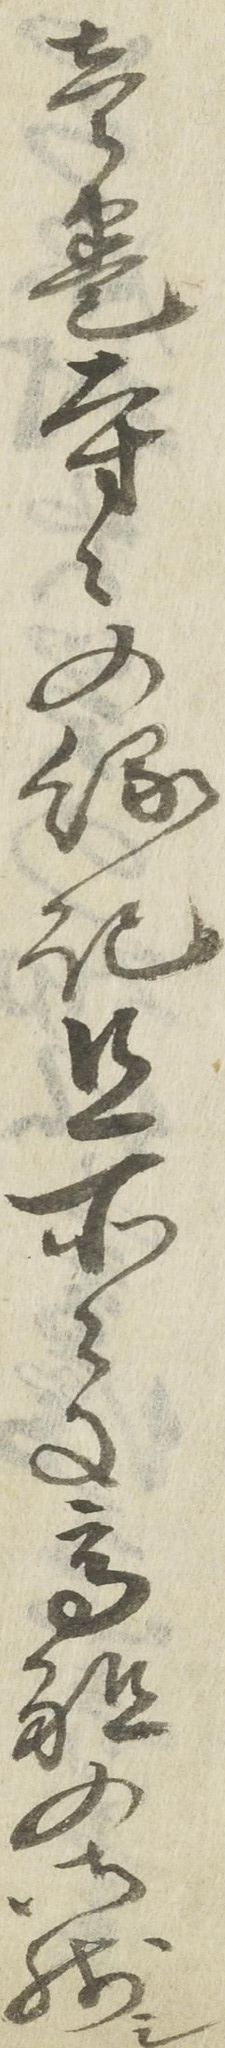壱巻寺々の縁起且所〻に高祖の御残シ
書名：後見笑
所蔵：東京大学地震研究所図書室 Earthquake Research Institute Library, The University of Tokyo, JAPAN
